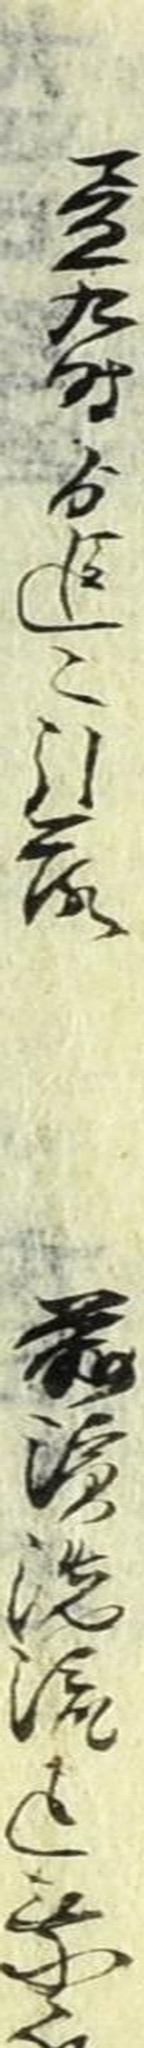昼九時ゟ追々引落前浜洗流迄乗水
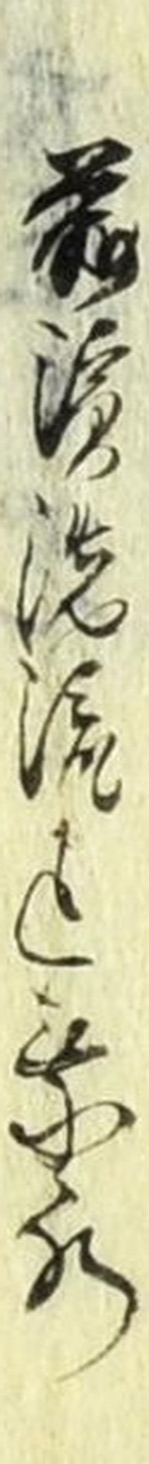前浜洗流迄乗水
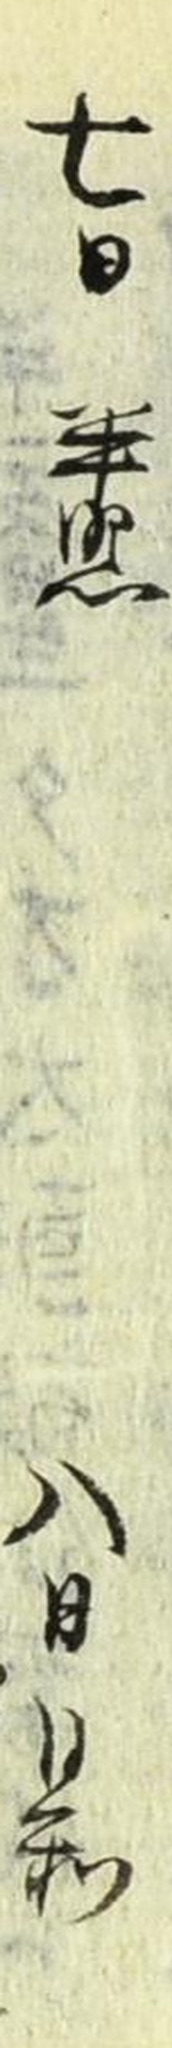七日半照八日日和
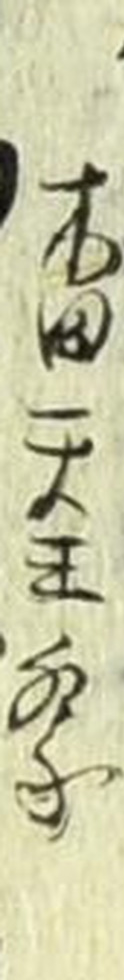木田天王祭
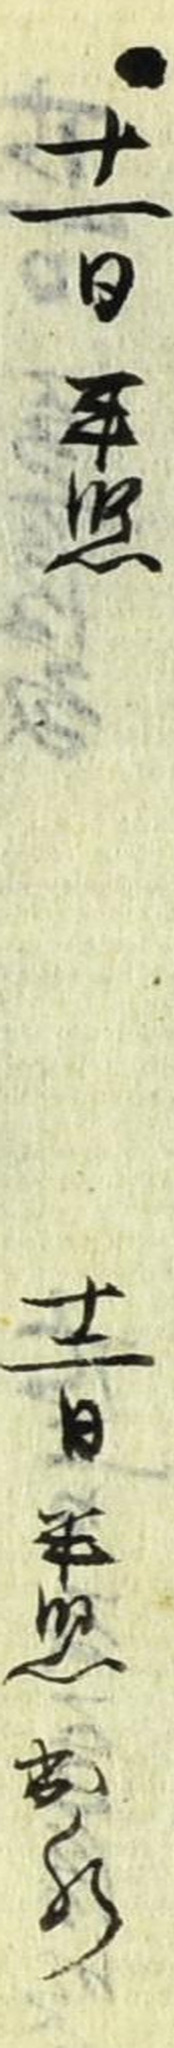●十一日半照十二日半照出水
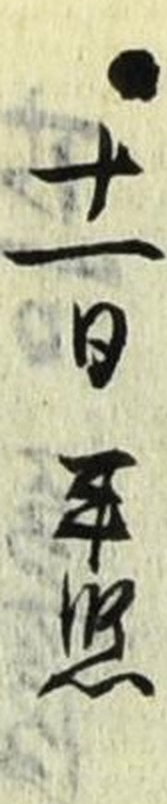十五日半照
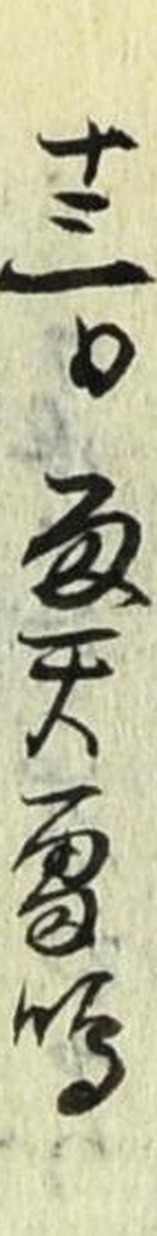十三日雨天雷鳴
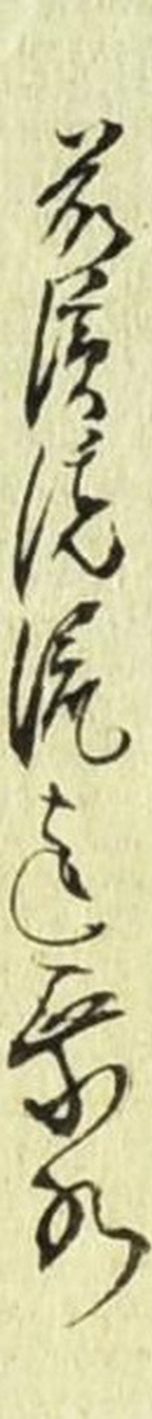前浜洗流迄乗水
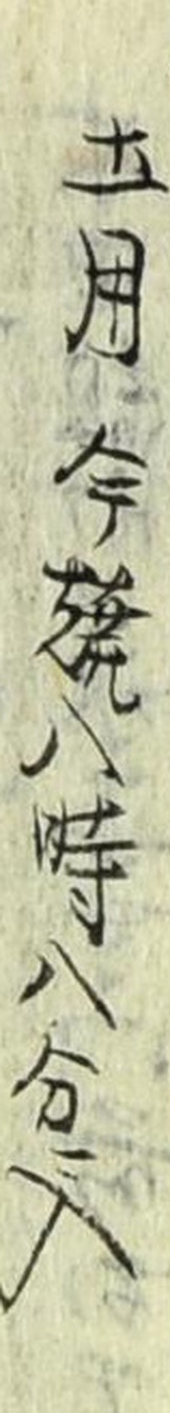土用今焼八時八分に入
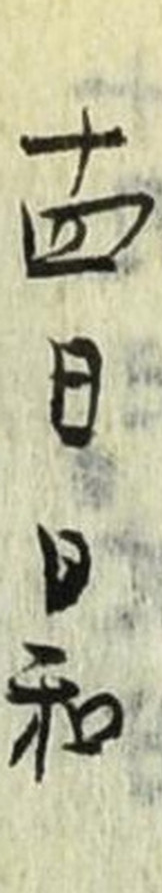十四日日和
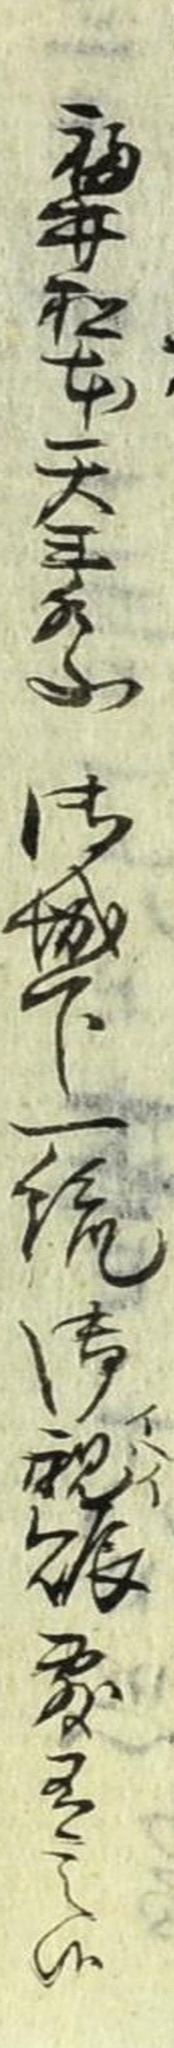福井松本天王祭御城下一統御祝賑敷有之候
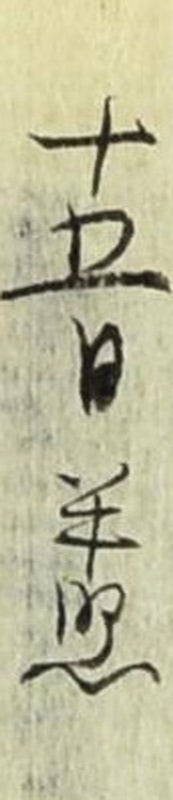十五日半照
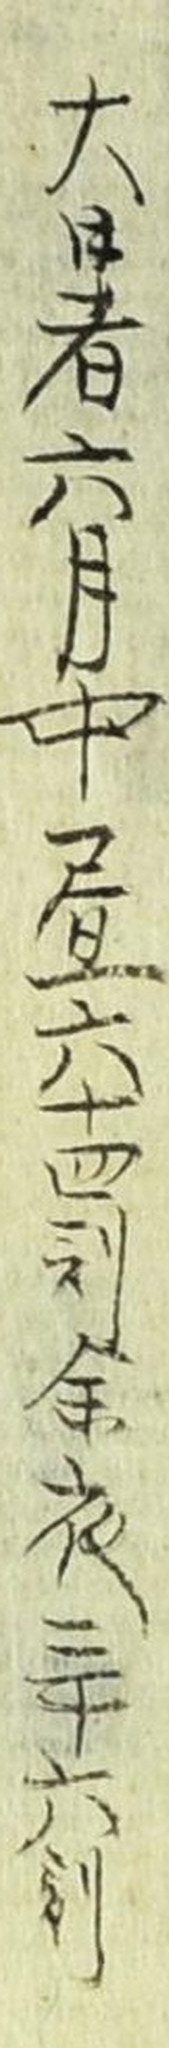大暑六月中昼六十四刻余夜三十六刻
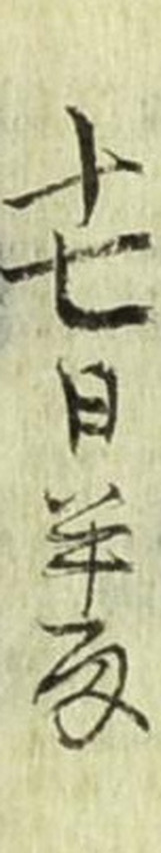十五日半照
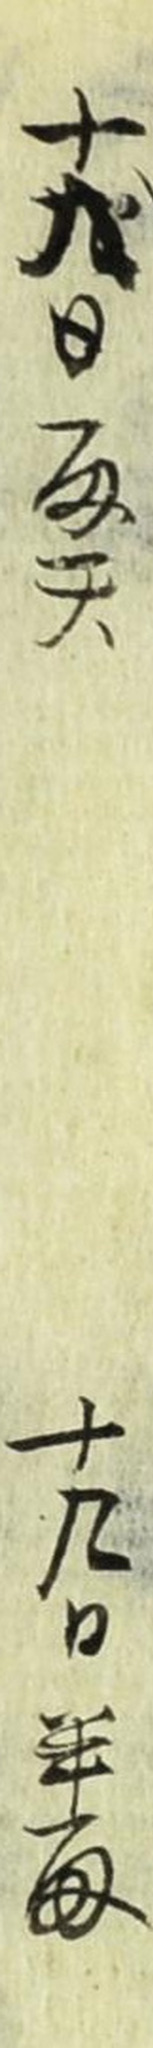十九日雨天十九日半雨
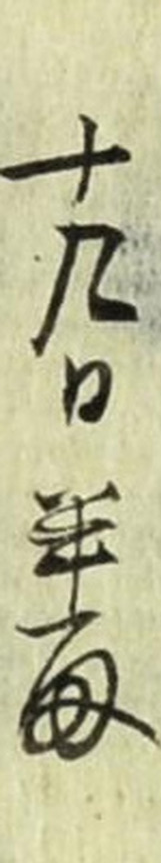十五日半照
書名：（日記）
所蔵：福井県文書館 Fukui Prefectural Archives
